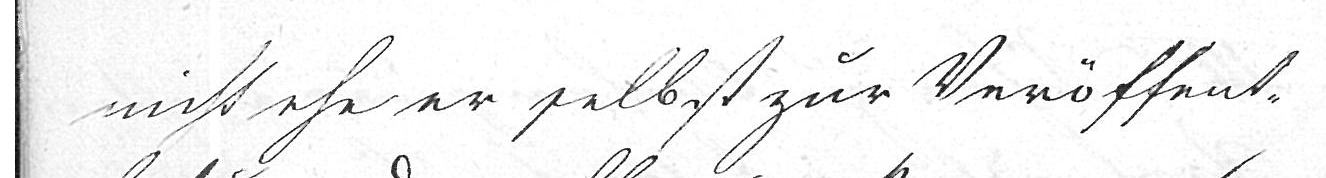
nicht ehe er selbst zur Veröffent-
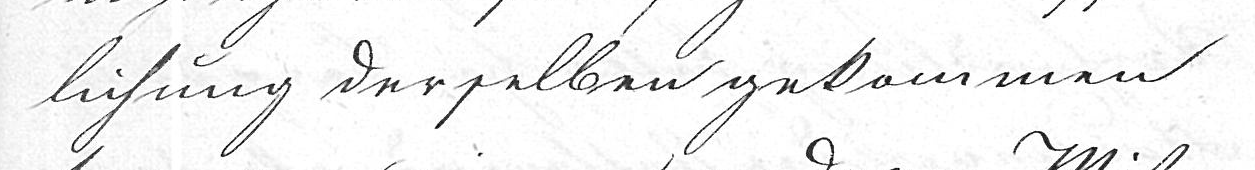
lichung derselben gekommen
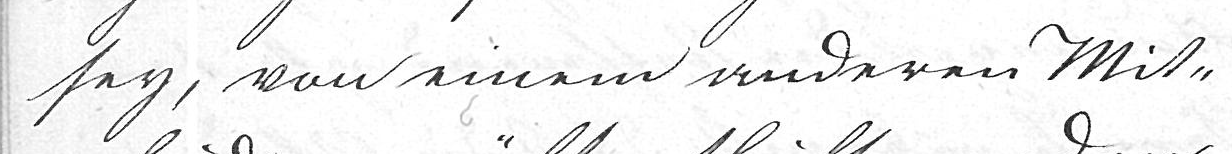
sey, von einem anderen Mit-
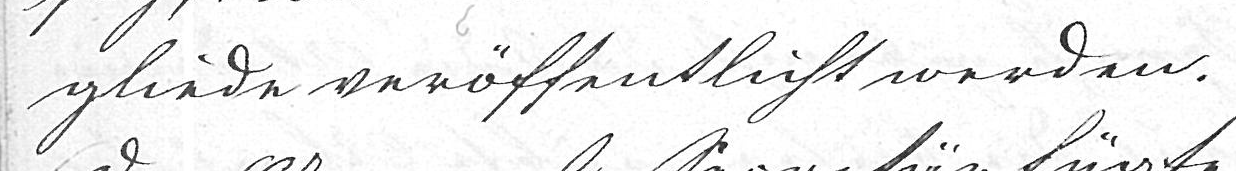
gliede veröffentlicht werden.
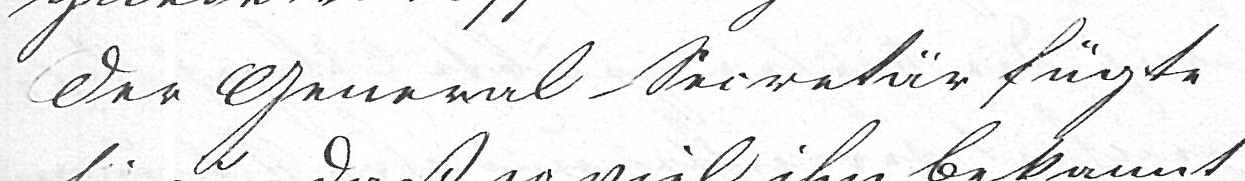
Der General-Secretär fügte
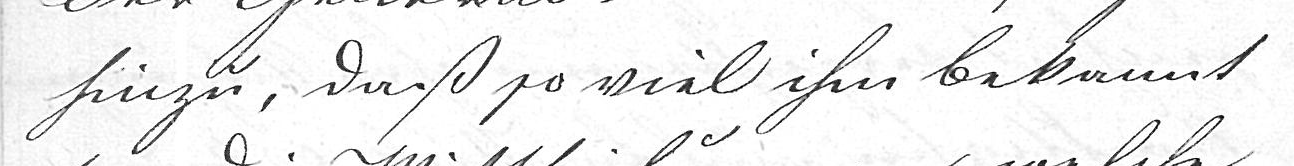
hinzu, daß so viel ihm bekannt
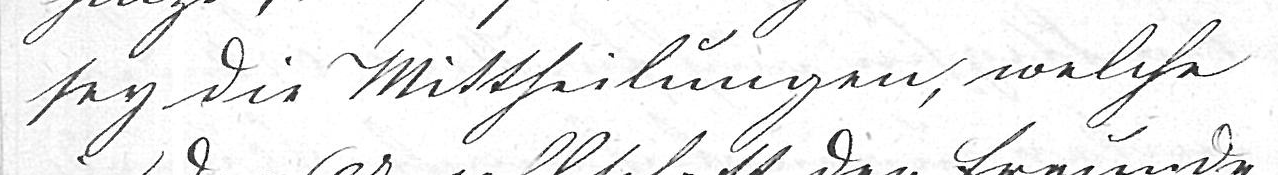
sey die Mittheilungen, welche
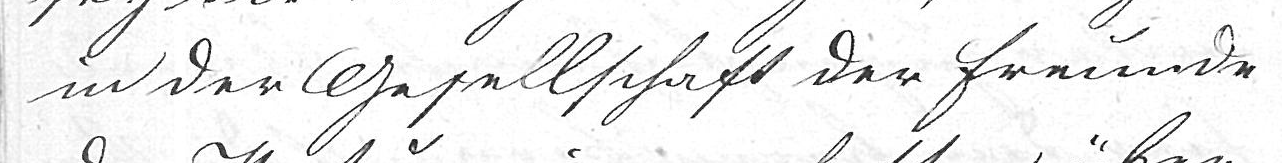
und der Gesellschaft der Freunde
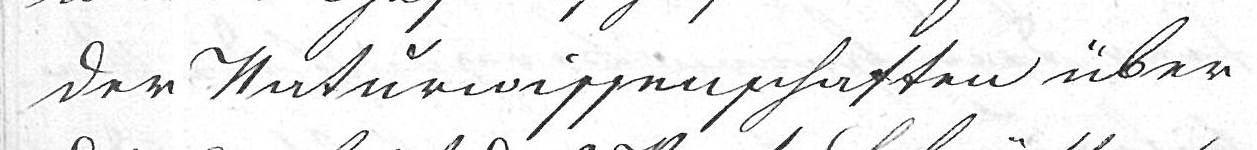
der Naturwissenschaften über
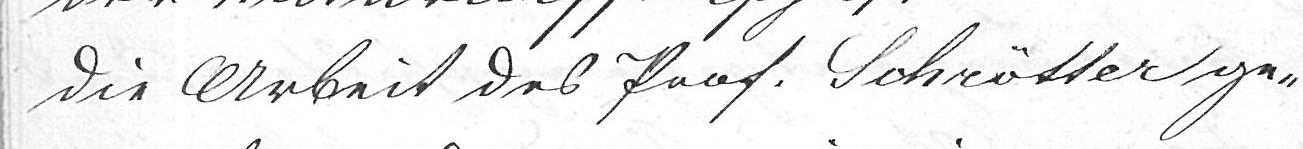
die Arbeit des Prof. Schrötter ge-
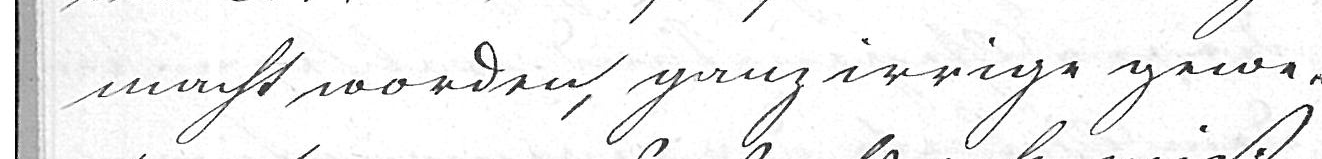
macht worden ganz irrige gewe-
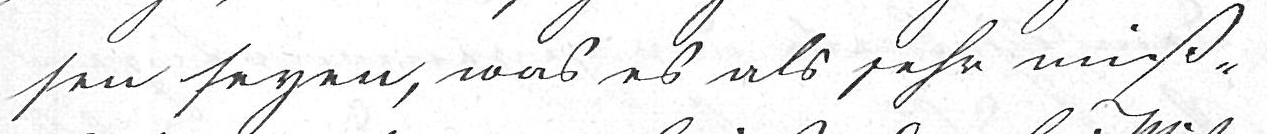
sen seyen, was es als sehr miß-
